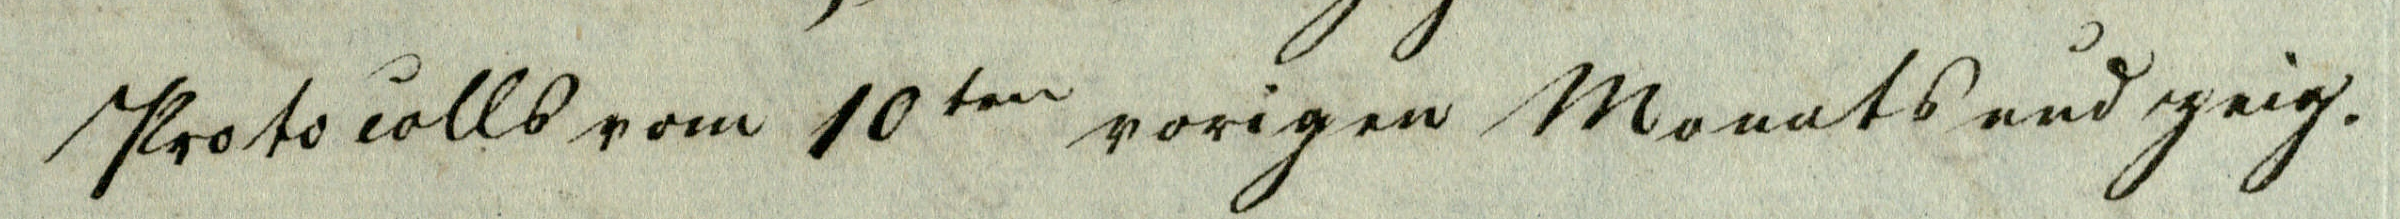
Protocolls vom 10ten vorigen Monats und zeig¬
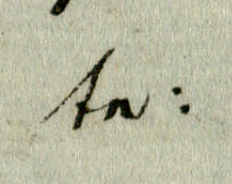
te:
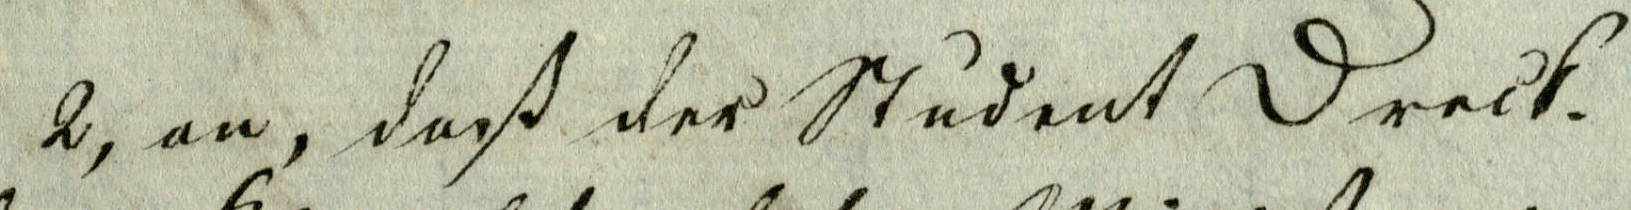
2, an, daß der Student Dreck¬
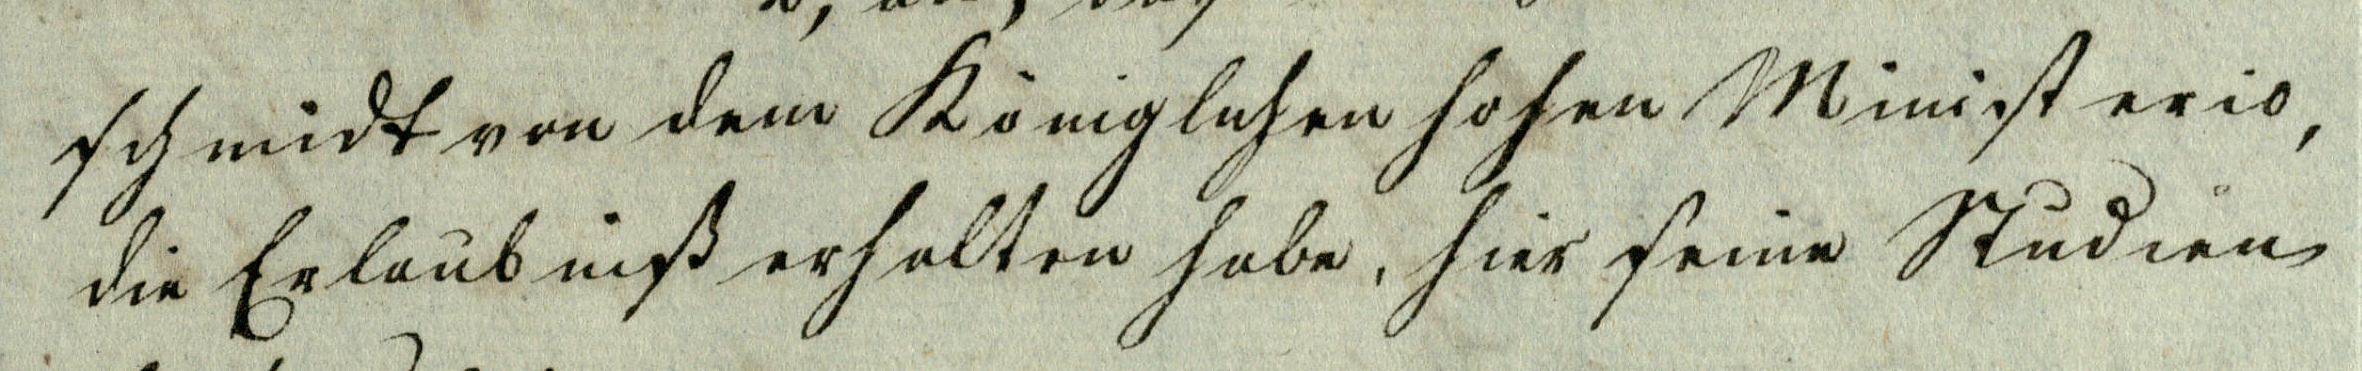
schmidt von dem Königlichen hohen Ministerio,
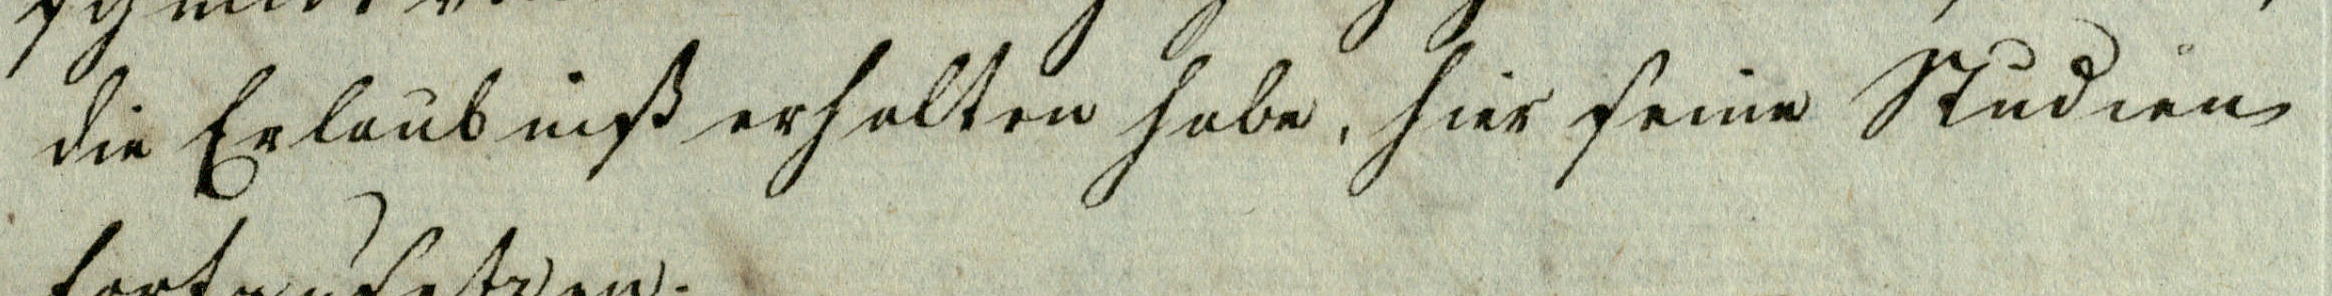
die Erlaubniß erhalten habe, hier seine Studien
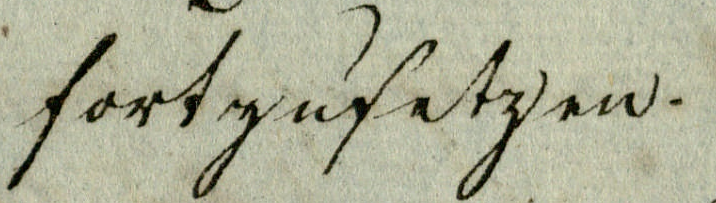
fortzusetzen.
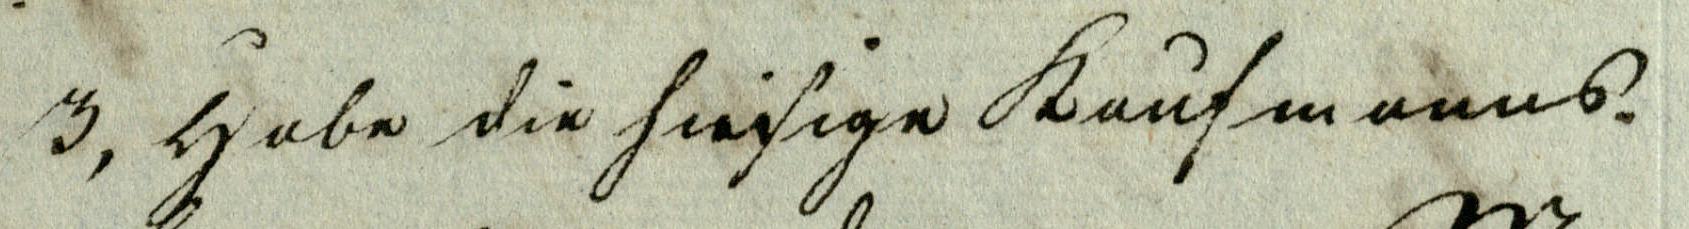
3, Habe die hiesige Kaufmanns¬
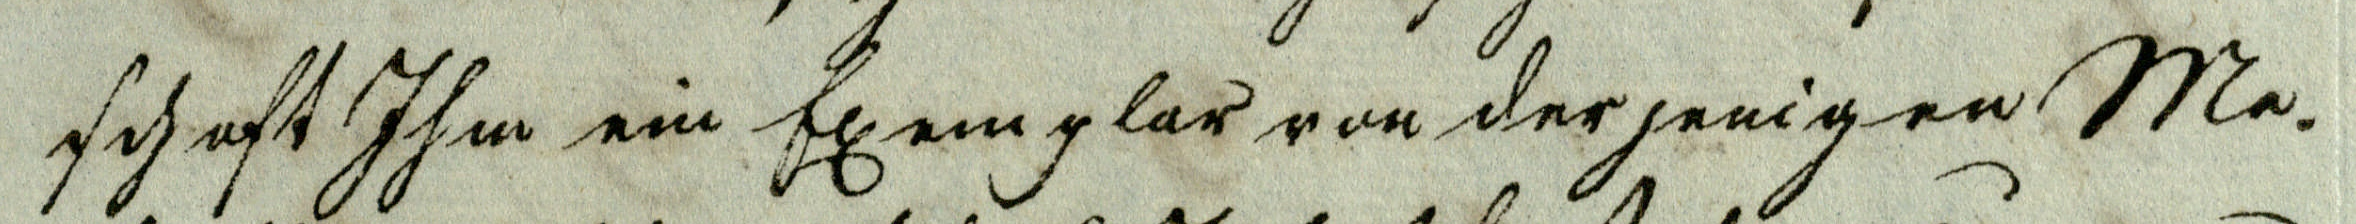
schaft Ihm ein Exemplar von derjenigen Me¬
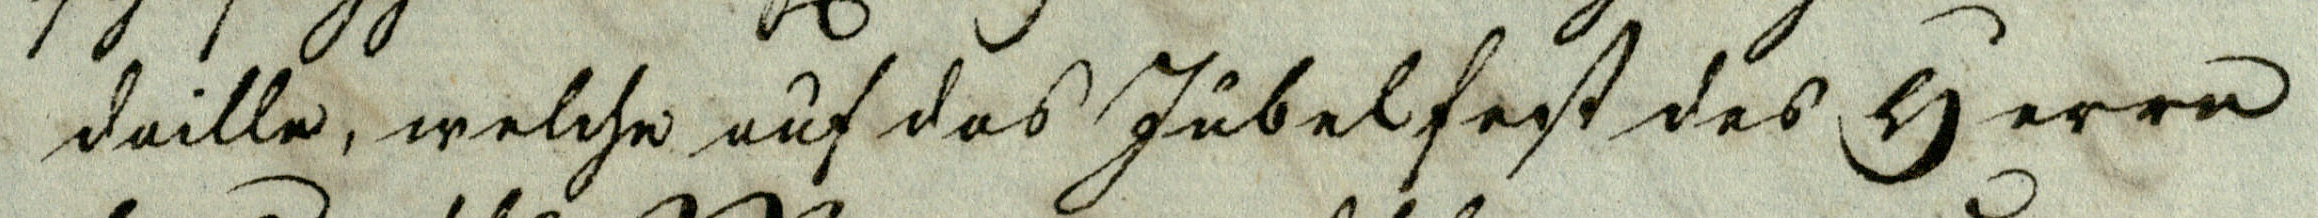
daille, welche auf das Jubelfest des Herrn
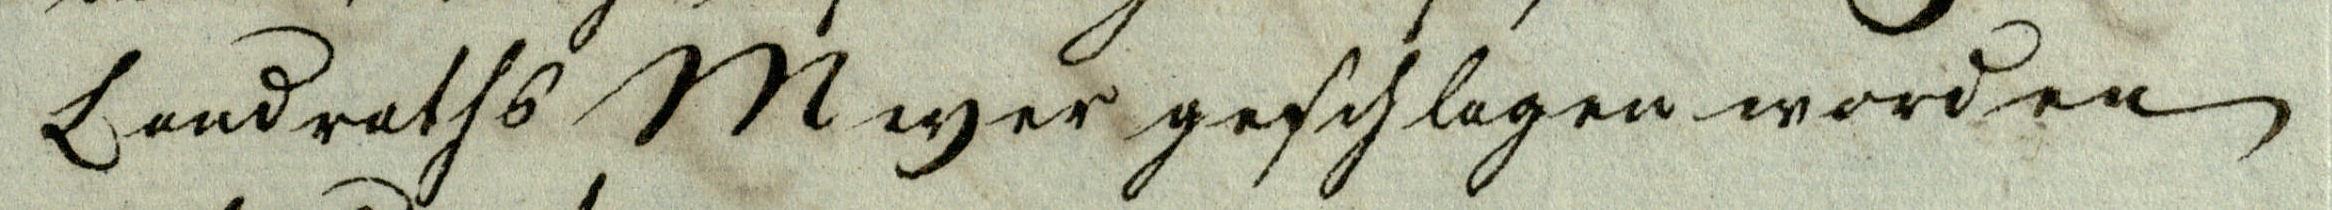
Landraths Meyer geschlagen worden
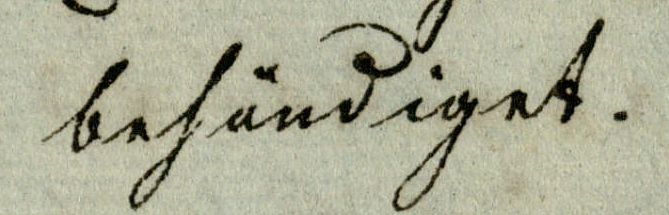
behändiget.
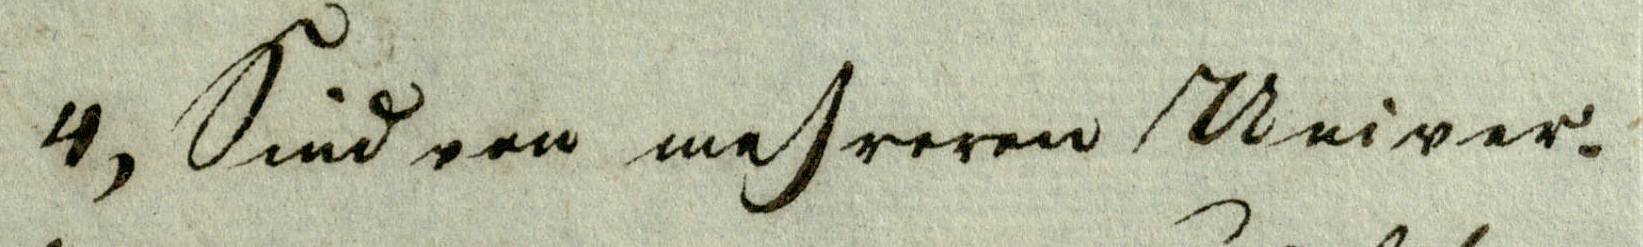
4, Sind von mehreren Univer¬
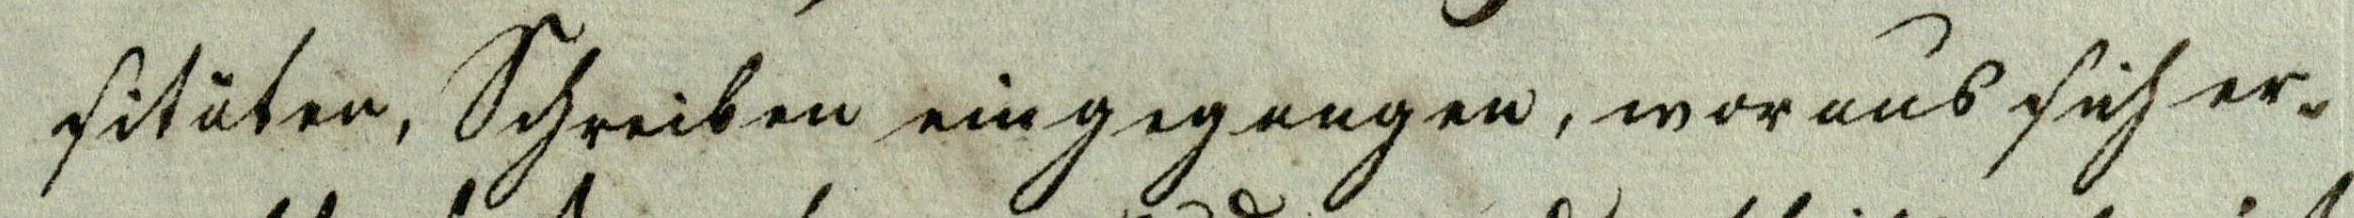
sitäten, Schreiben eingegangen, woraus sich er¬
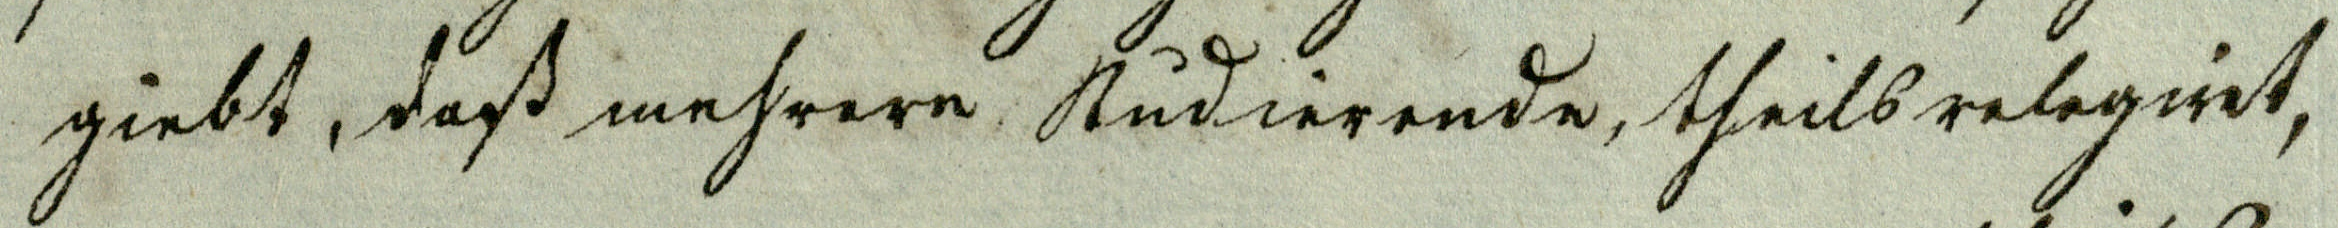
giebt, daß mehrere Studierende, theils relegiret,
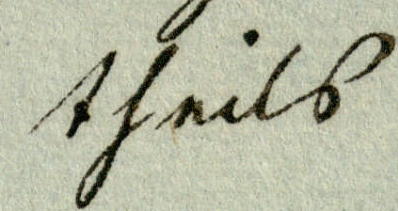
theils
